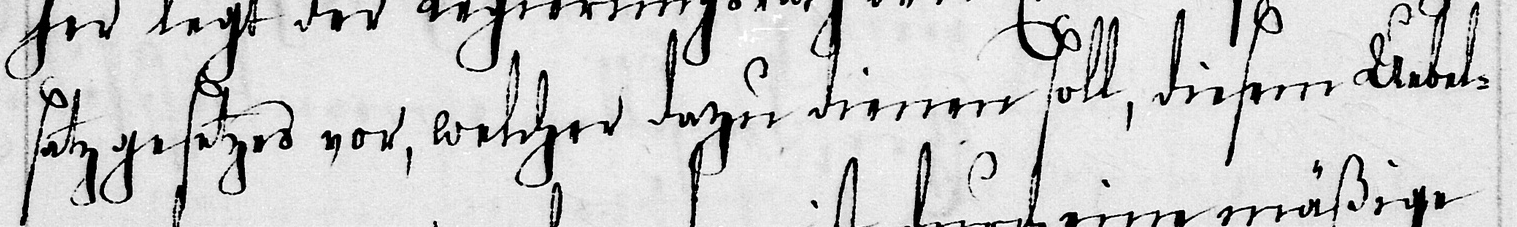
satzgesetzes vor, welcher dazu dienen soll, diesem Uebel¬
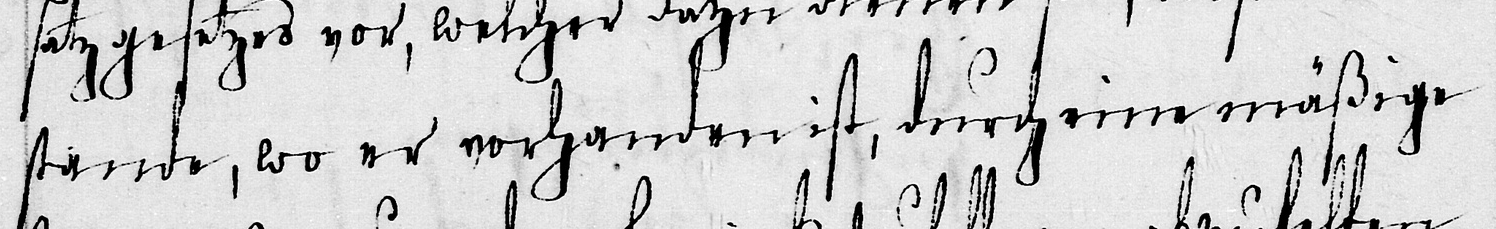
stande, wo er vorhanden ist, durch eine mäßige
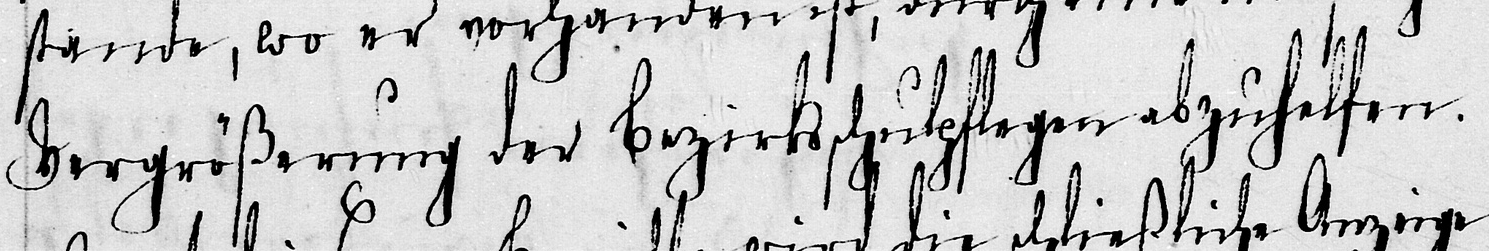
Vergrößerung der Bezirksschulpflegen abzuhelfen.
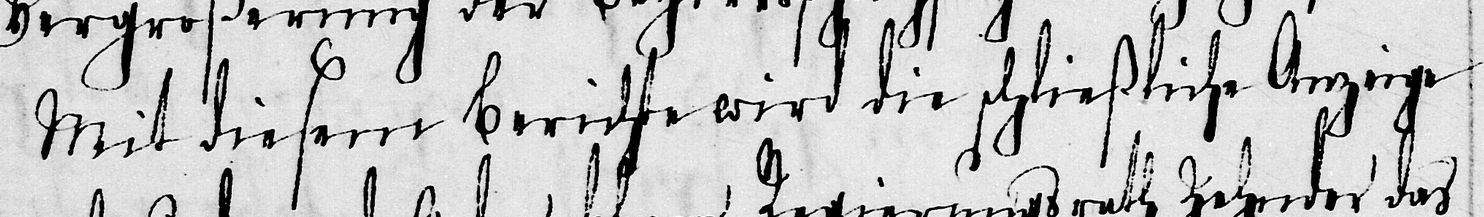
Mit diesem Berichte wird die schließliche Anzeige
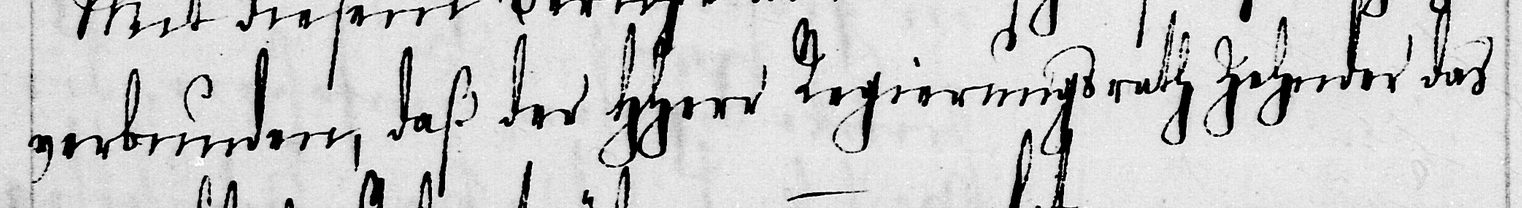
verbunden, daß der HHerr Regierungsrath Zehnder das
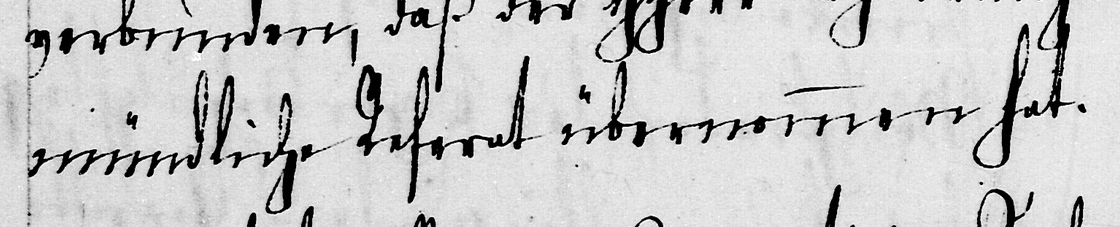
mündliche Referat übernommen hat.
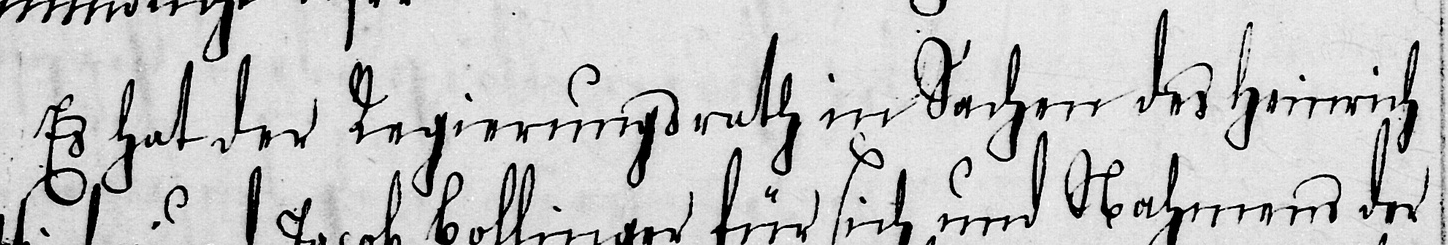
Es hat der Regierungsrath in Sachen des Heinrich
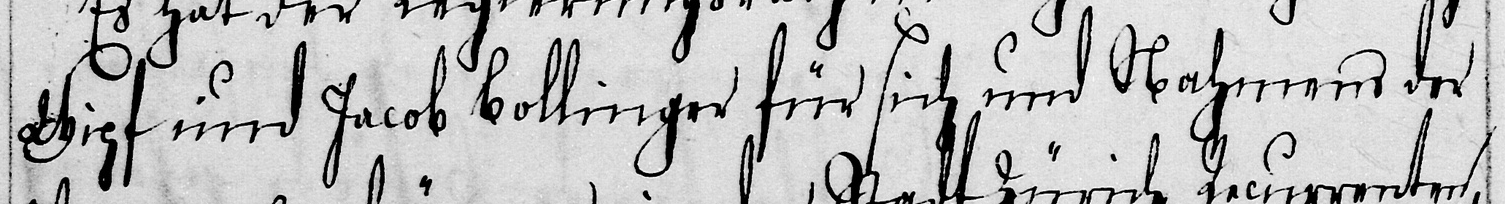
Wipf und Jacob Bollinger für sich und Nahmens der
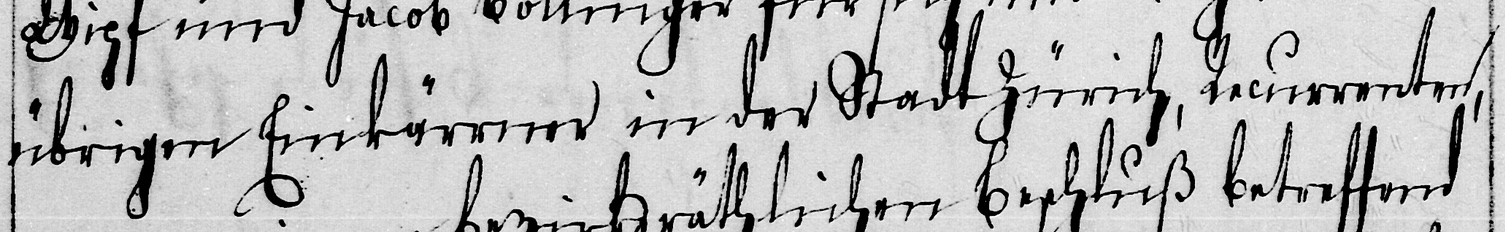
übrigen Einkärrner in der Stadt Zürich, Recurrenten,
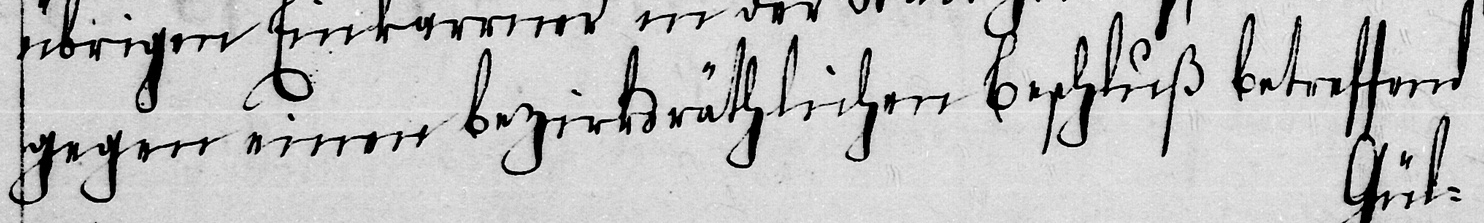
gegen einen bezirksräthlichen Beschluß betreffend
